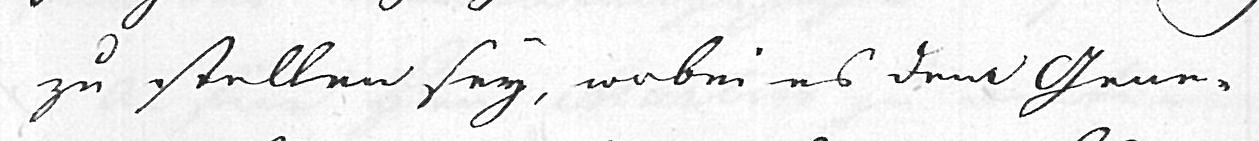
zu stellen sey, wobei es dem Gene-
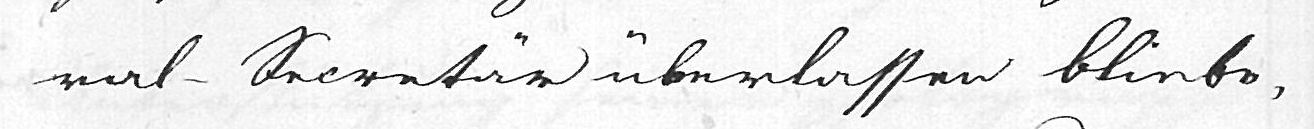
ral-Secretär überlassen bliebe,
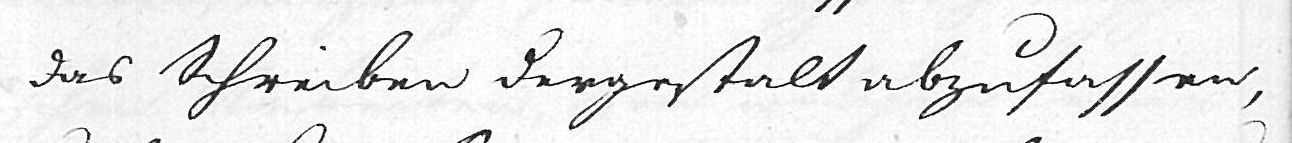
das Schreiben dergestalt abzufassen,
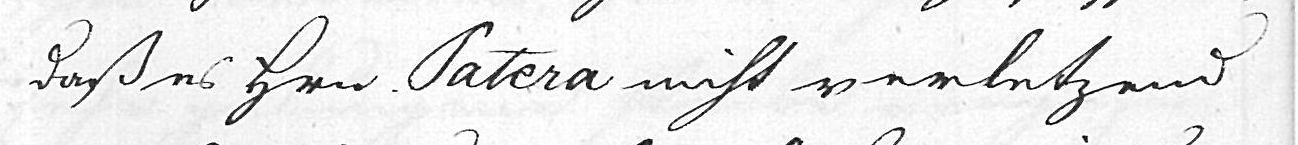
daß es Hrn. Patera nicht verletzend
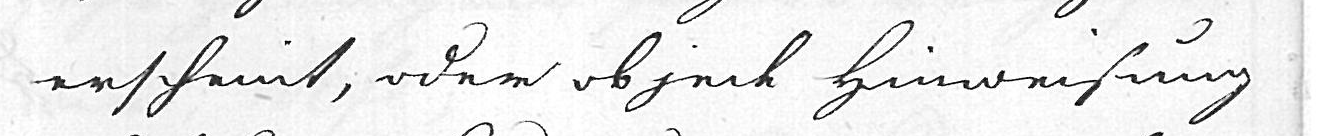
erscheint, oder ob jede Hinweisung
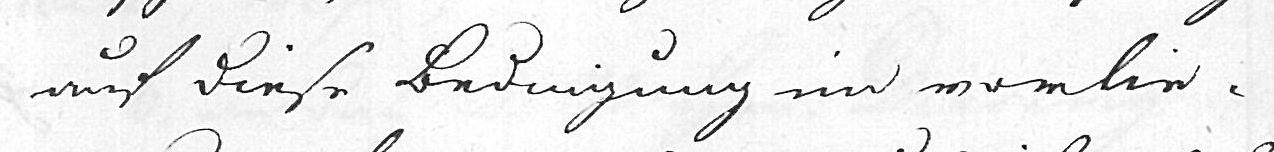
auf diese Bedingung im vorlie-
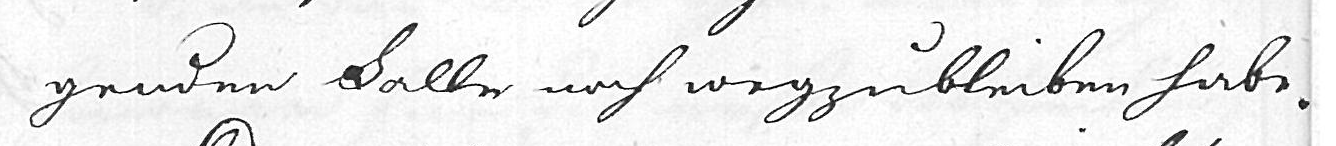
genden Falle noch wegzubleiben habe.
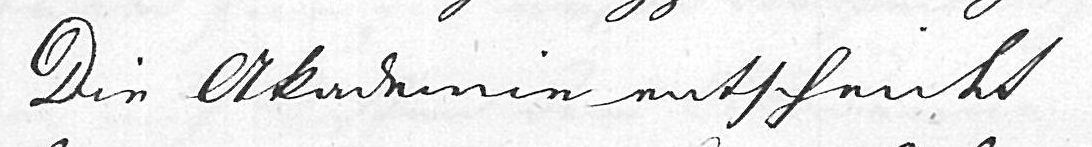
Die Akademie entscheidet
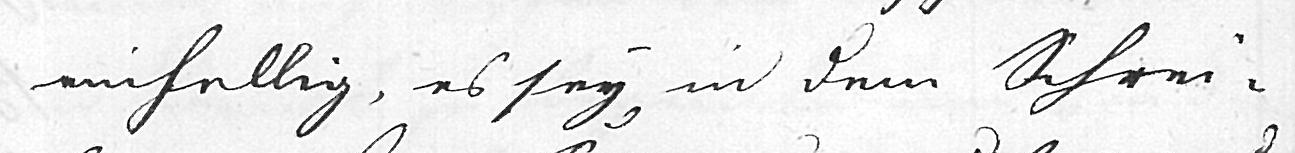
einhellig, es sey in dem Schrei-
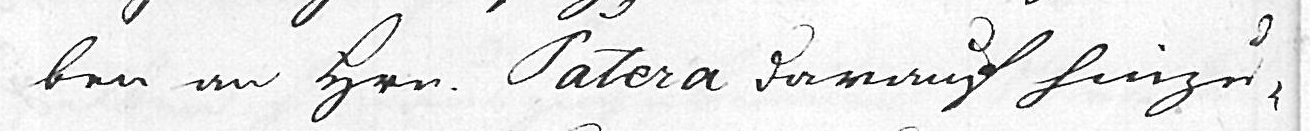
ben an Hrn. Patera darauf hinzu-
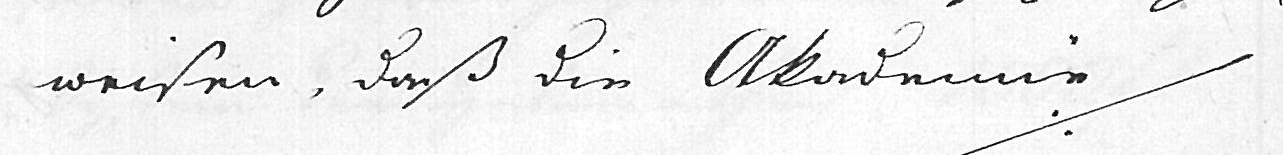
weisen, daß die Akademie
